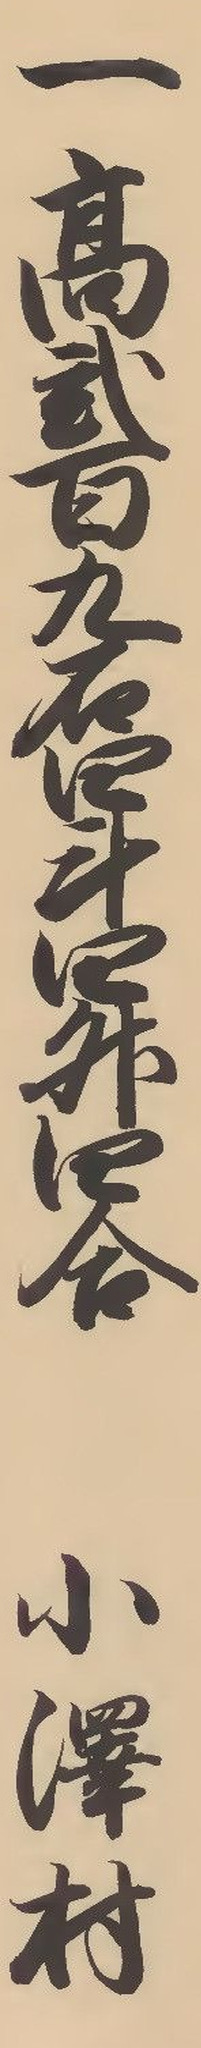一高弐百九石四斗四升四合小沢村
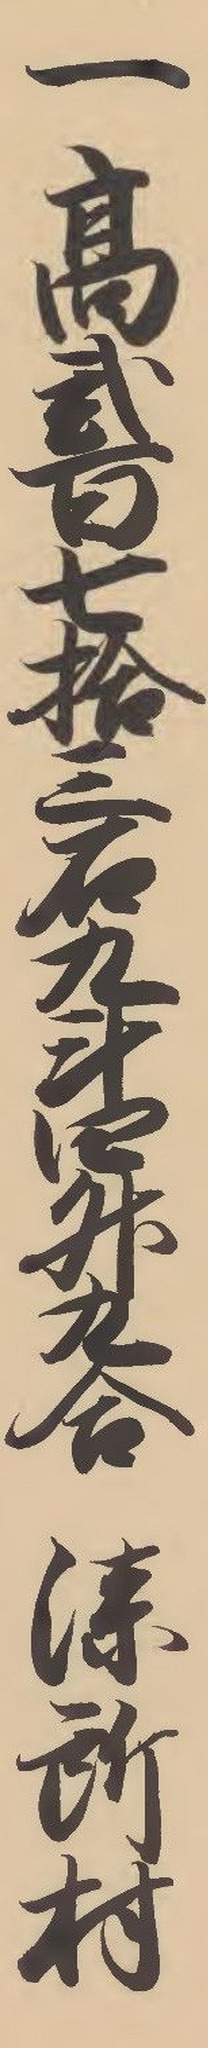一高弐百七拾三石九斗四升九合漆所村
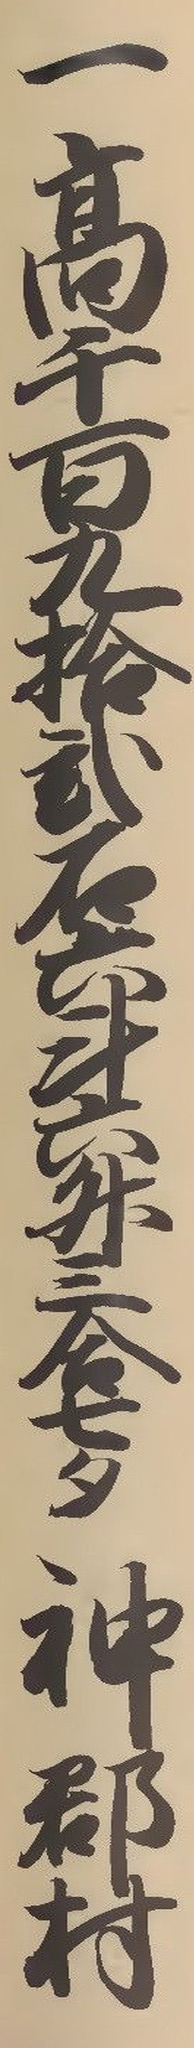一高千百九拾弐石六斗六升三合七勺神郡村
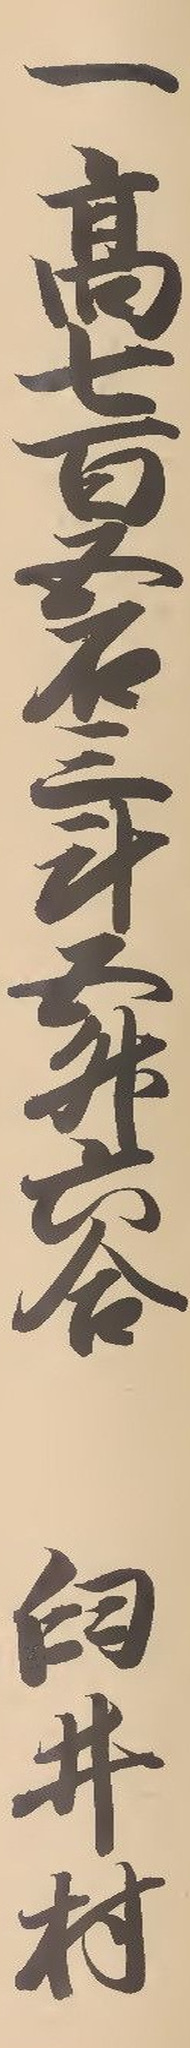一高七百五石三斗五升六合臼井村
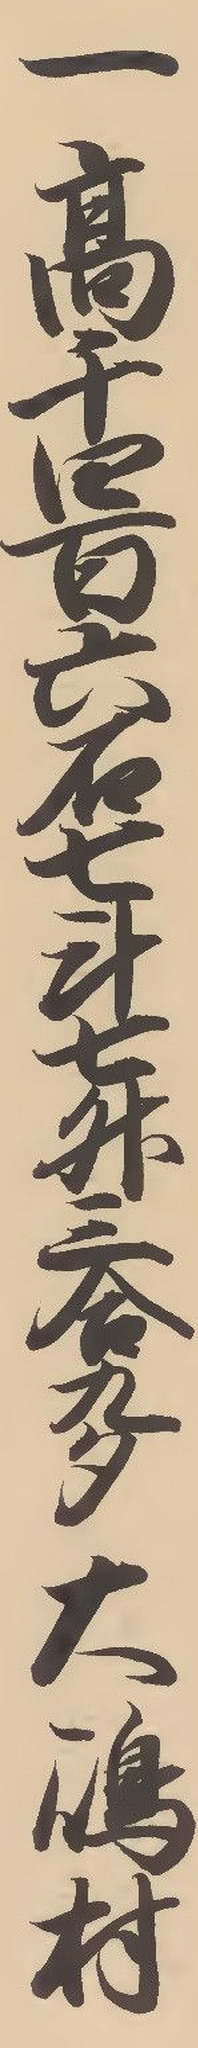一高千四百六石七斗七升三合九勺大島村
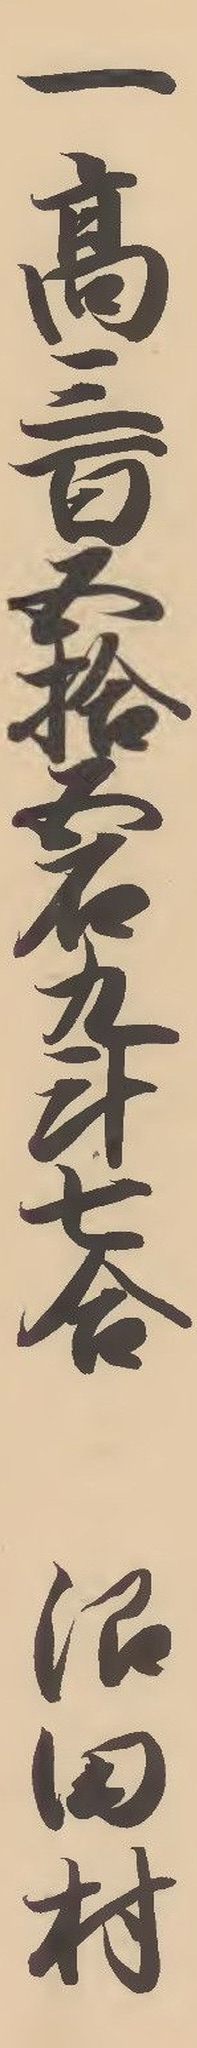一高三百五拾五名九斗七合沼田村

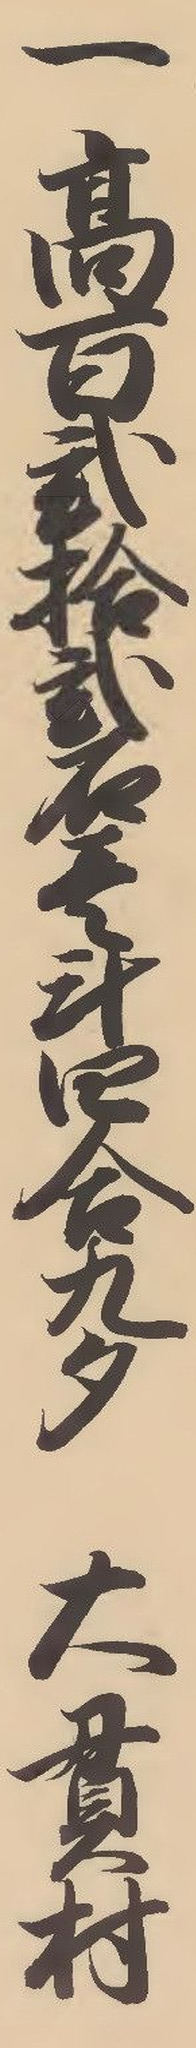一高百弐拾弐石壱斗四合九勺大貫村
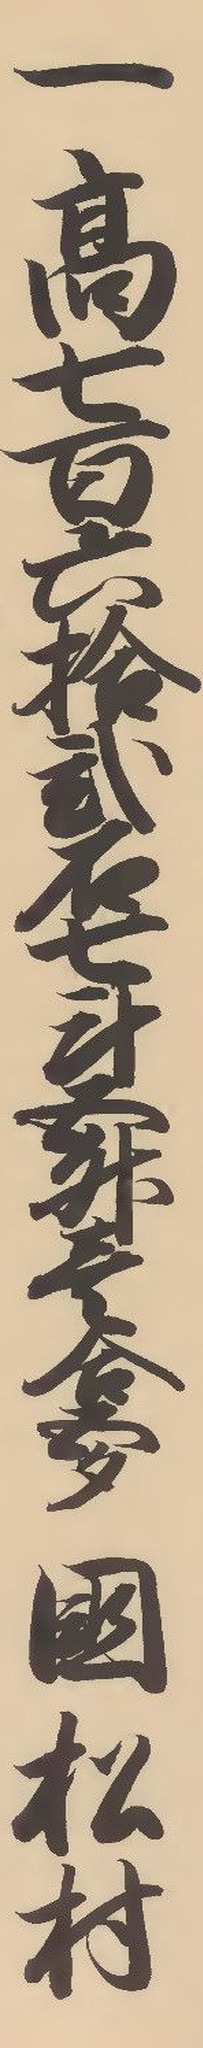一高七百六拾弐石七斗五升壱合五勺国松村
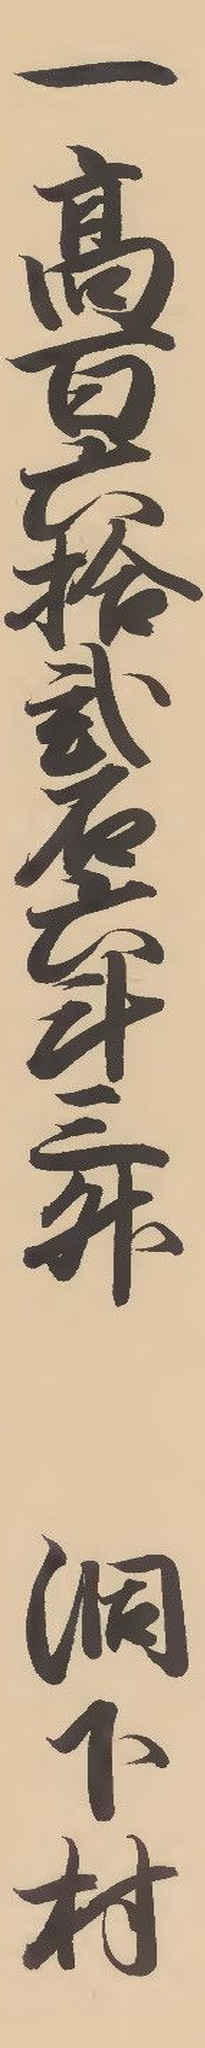一高百六拾弐石六斗三升洞下村
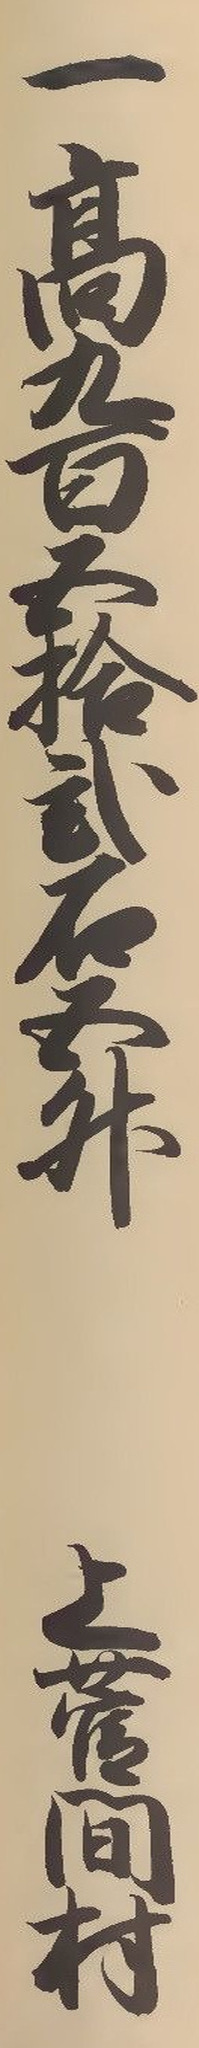一高九百五拾弐石五升上菅間村
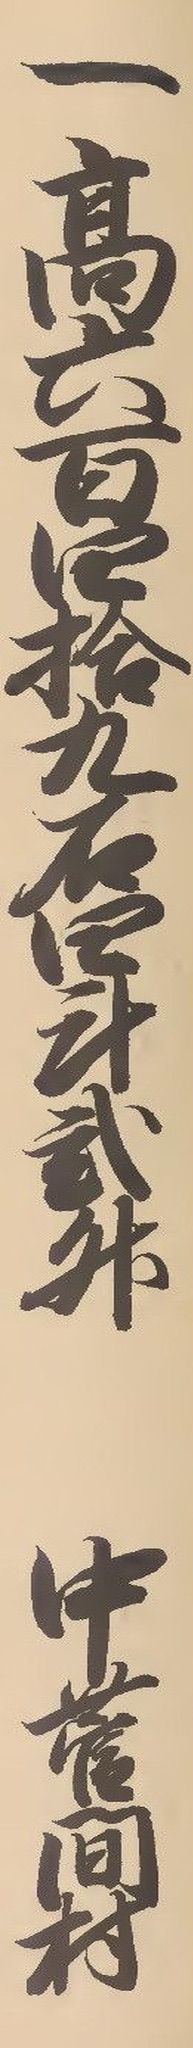一高六百四拾九石四斗弐升中菅間村
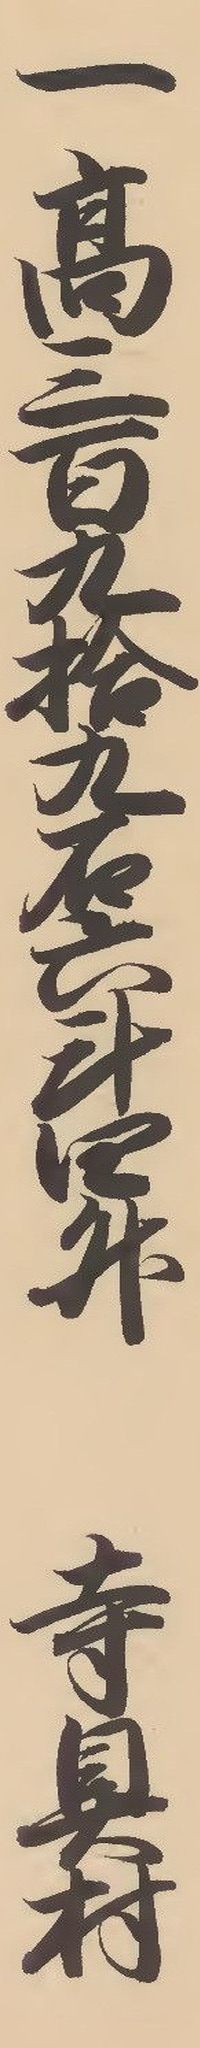一高三百九拾九石六斗四升寺具村
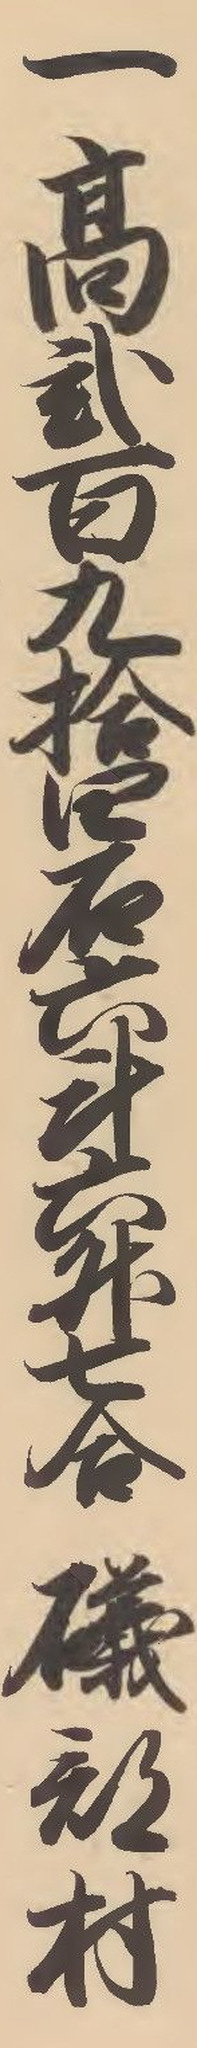一高弐百九拾四石六斗六升七合磯部村
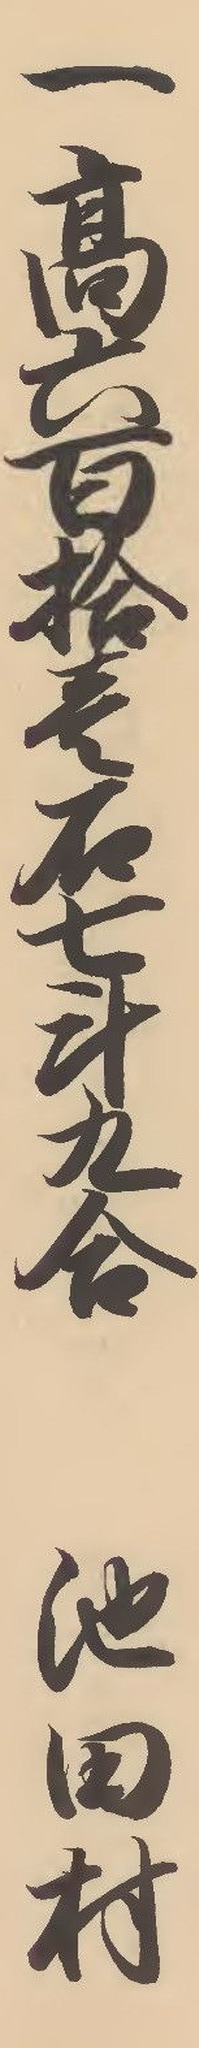一高六百拾壱石七斗九合池田村

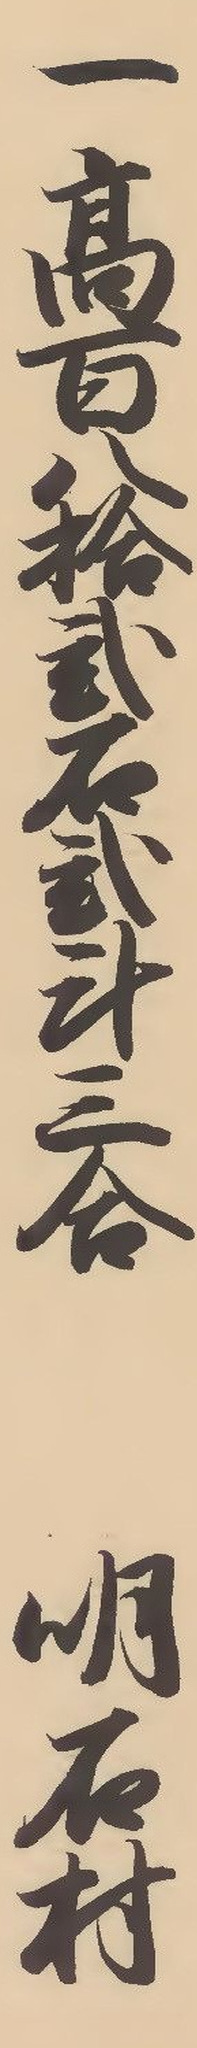一高百八拾弐石弐斗三合明石村
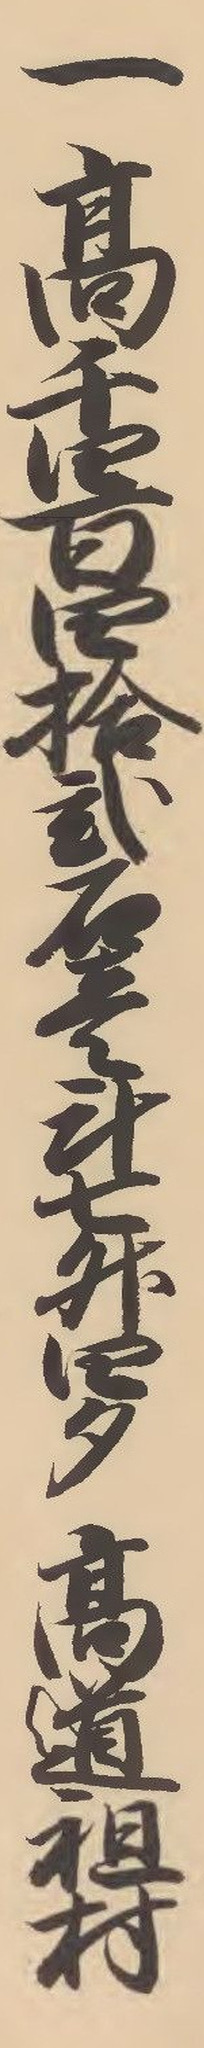一高千四百四拾弐石壱斗七升四勺高道祖村
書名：常陸国郷帳
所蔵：国立公文書館 National Archives of Japan
